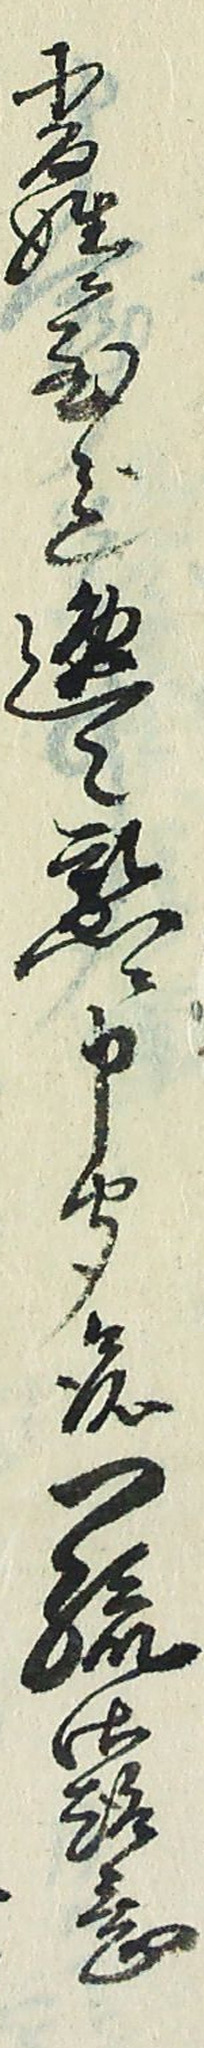小百姓ニ至迄逸々懇ニ申聞候所一統御趣意
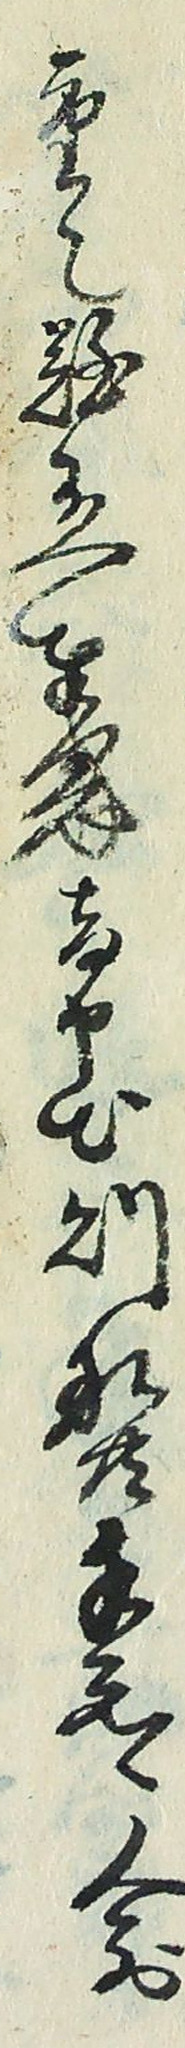重々難有奉畏旨申出則私共手元へ人別
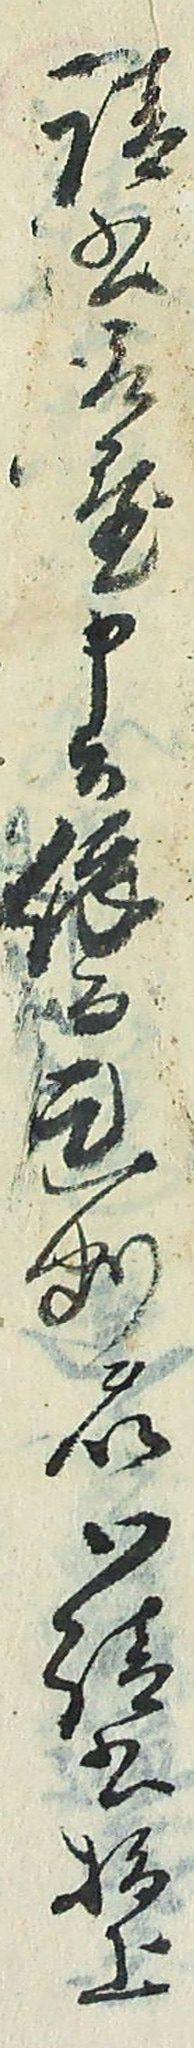請書取置申候依而連判ヲ以御請書指上
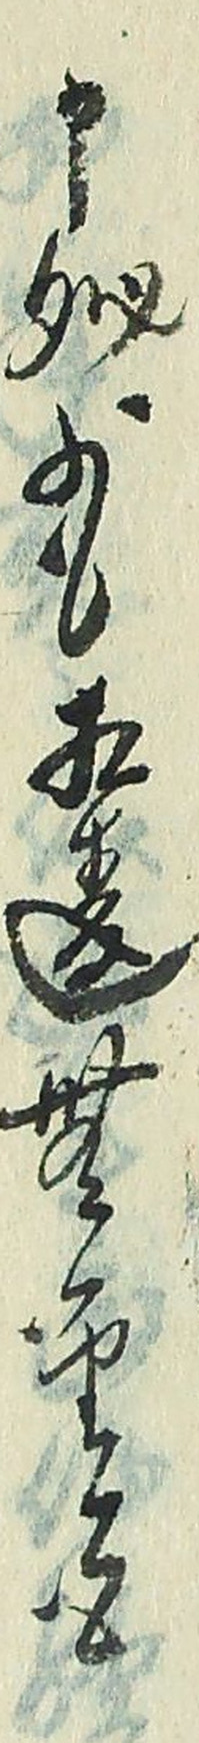申処少も相違無御坐候以上
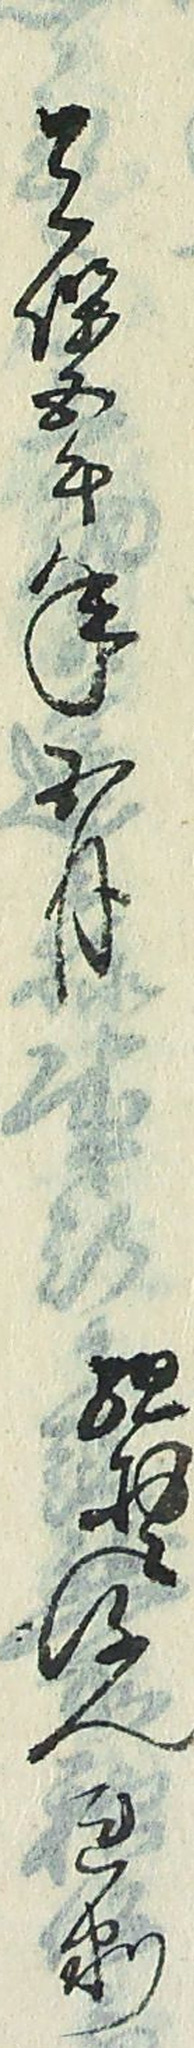天保五午年五月組村々役人連判
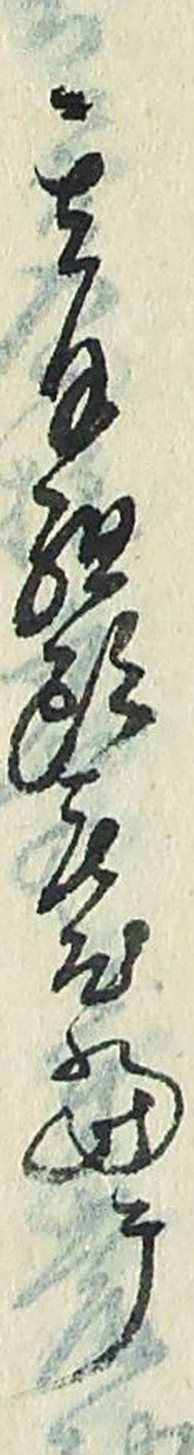其手組頭庄屋當テ
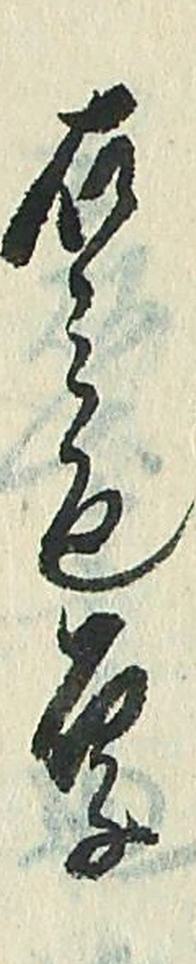右之通厚
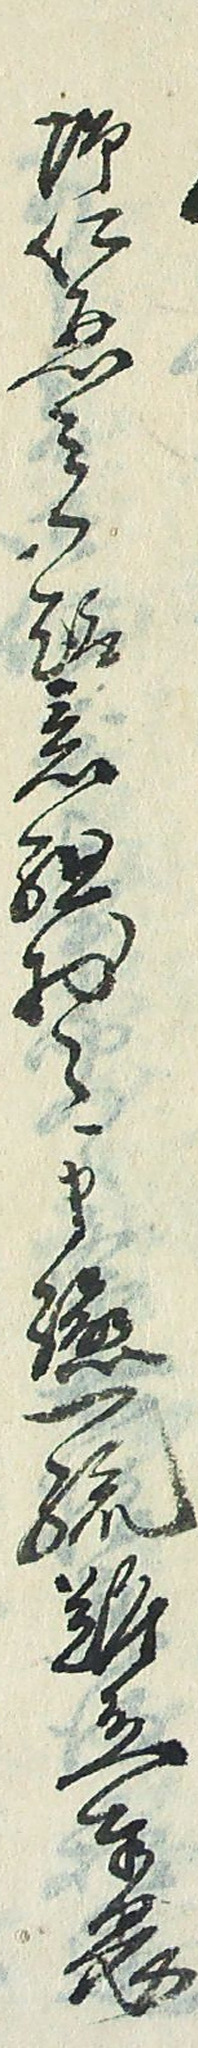御仁恵之御趣意組村々へ申諭一統難有奉畏
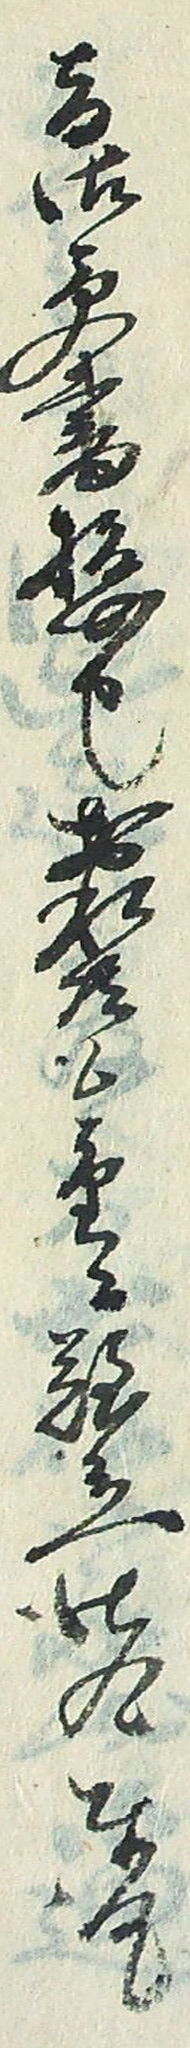旨御受書指出申候於私共も重々難有仕合奉存候

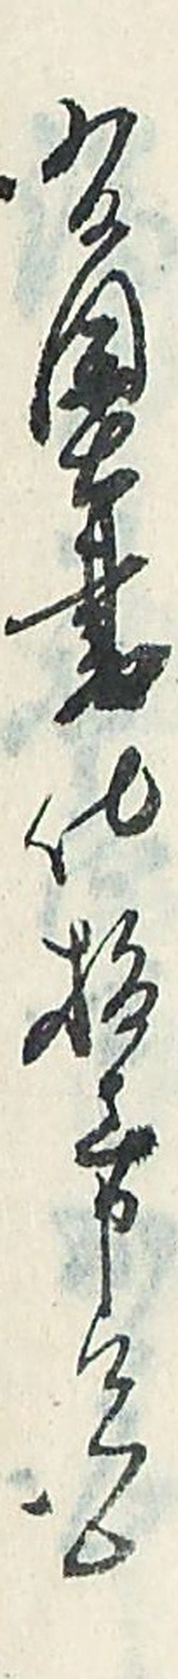仍而奥書仕指上申候以上
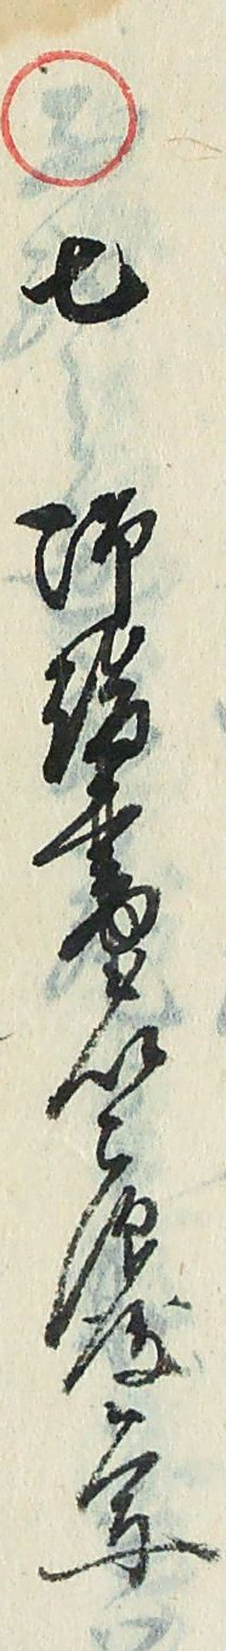○七御端書ヲ以被仰渡候写
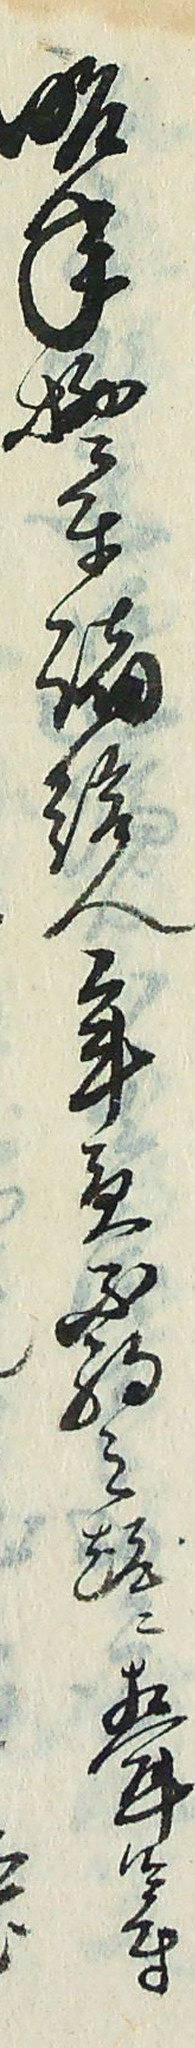昨年柄ニ付諸給人年貢不約之趣ニ相聞候ニ付
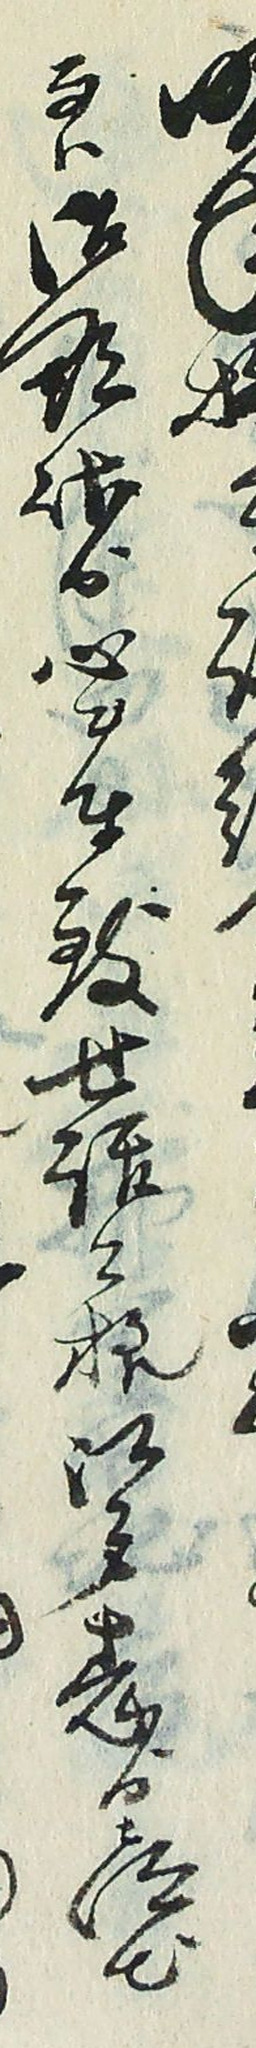而ハ御郡代ゟ心ヲ付致世話候様江戸表ゟ被仰出
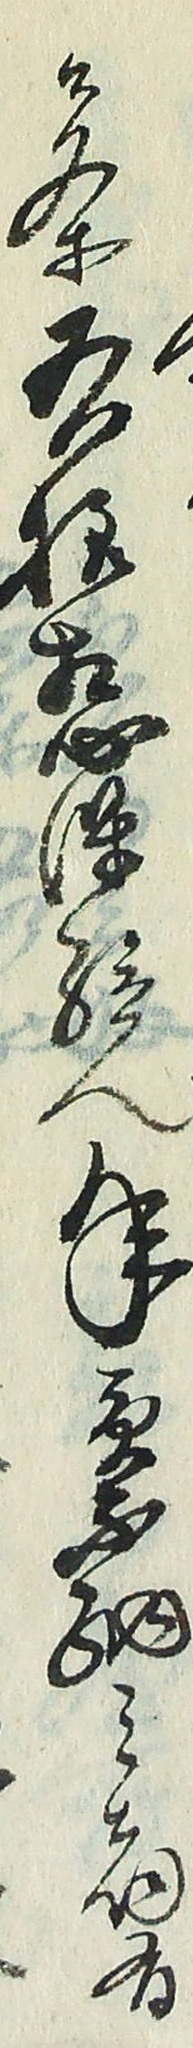候条右様相心得給人年貢不納之者有
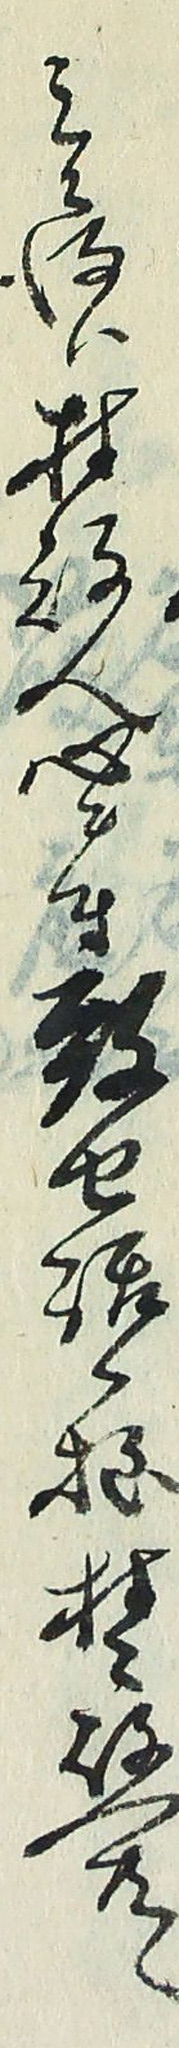之候得ハ村役人心ヲ付致世話候様村々役人共へ
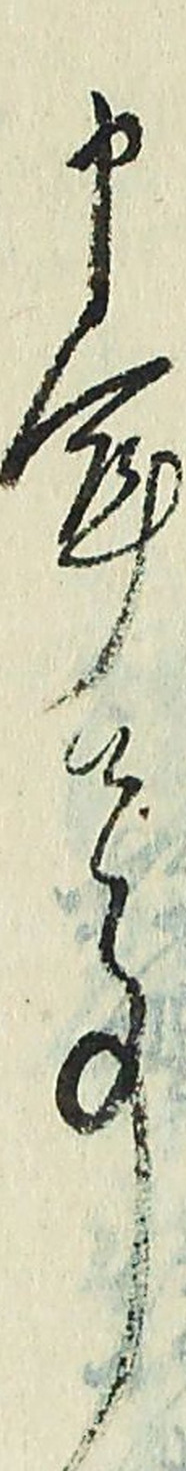申聞候事
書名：諸御趣意書并御下知向之写
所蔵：鳴門教育大学 Naruto University of Education
